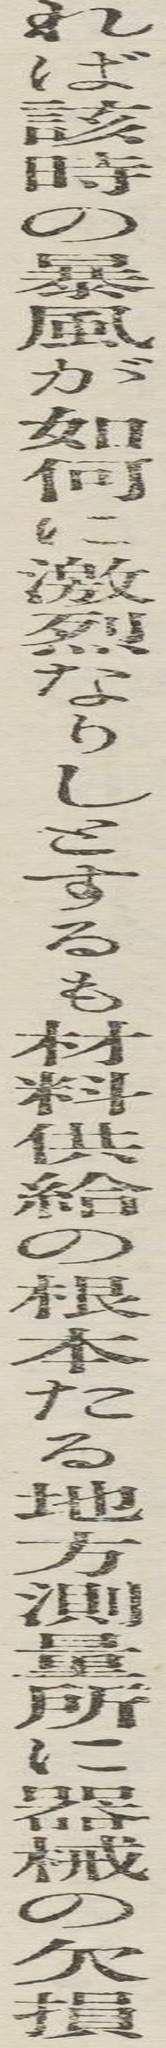れば該時の暴風が如何に激烈なりしとするも材料供給の根本たる地方測候所に器械の欠損
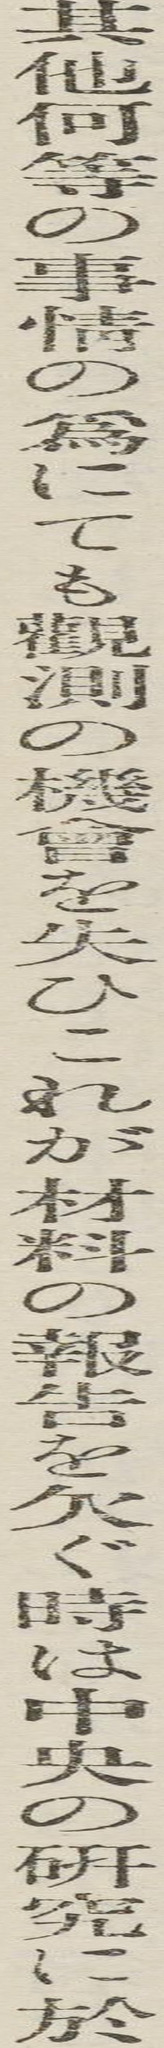其他何等の事情の為にても観測の機会を失ひこれが材料の報告を欠ぐ時は中央の研究に於
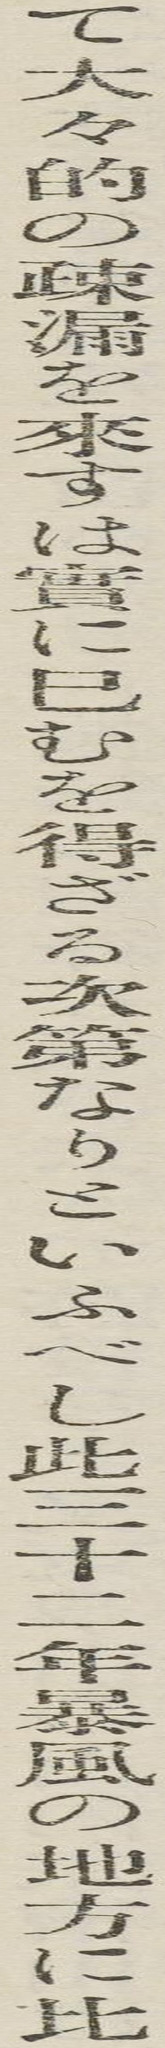て大々的の疎漏を来すは実に已むを得ざる次第なりといふべし此三十二年暴風の地方に比
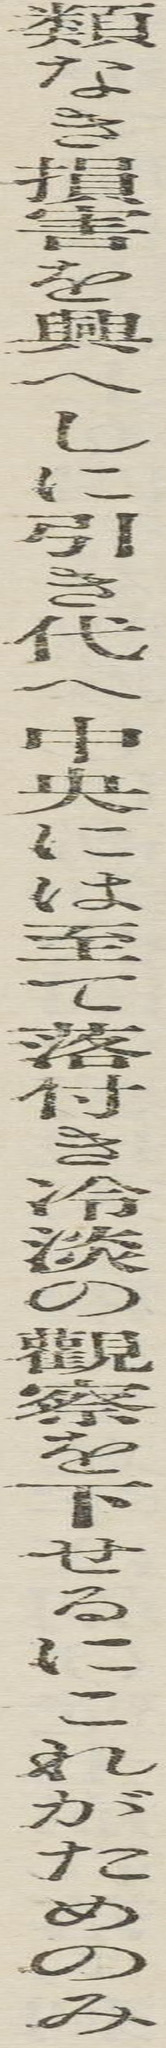類なき損害を興へしに引き代へ中央には至て落付き冷淡の観測を下せるにこれがためのみ
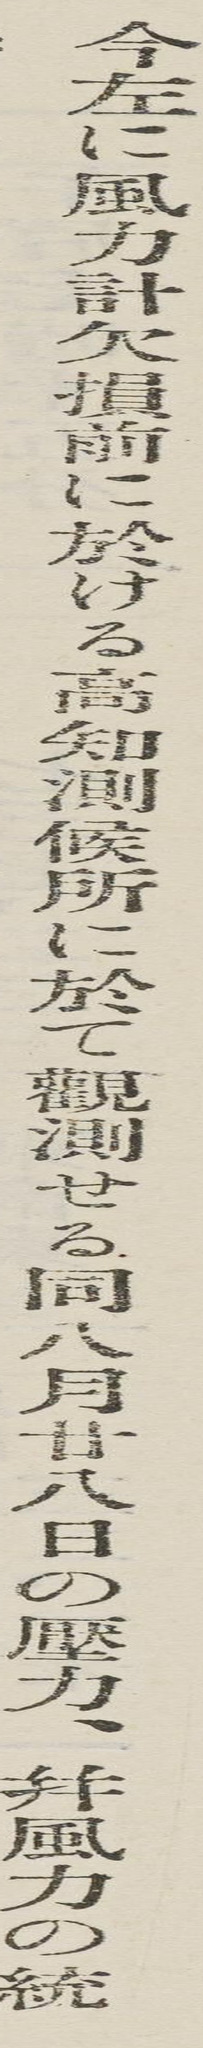今左に風力計欠損前に於ける高知測候所に於て観測せる同八月廿八日の圧力、幷風力の統
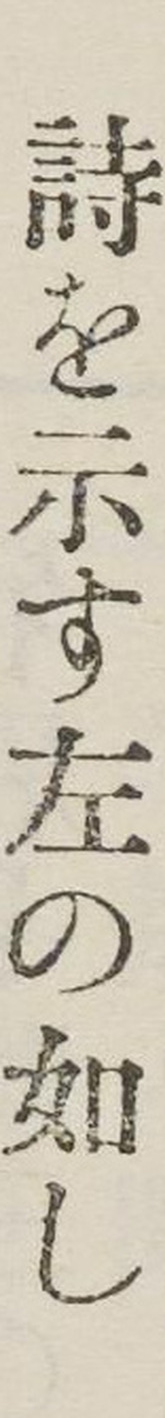詩を示す左の如し
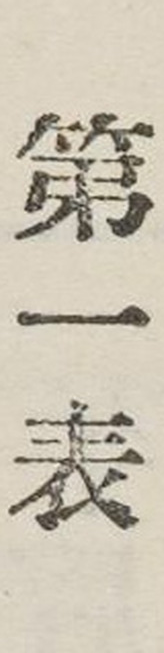第一表
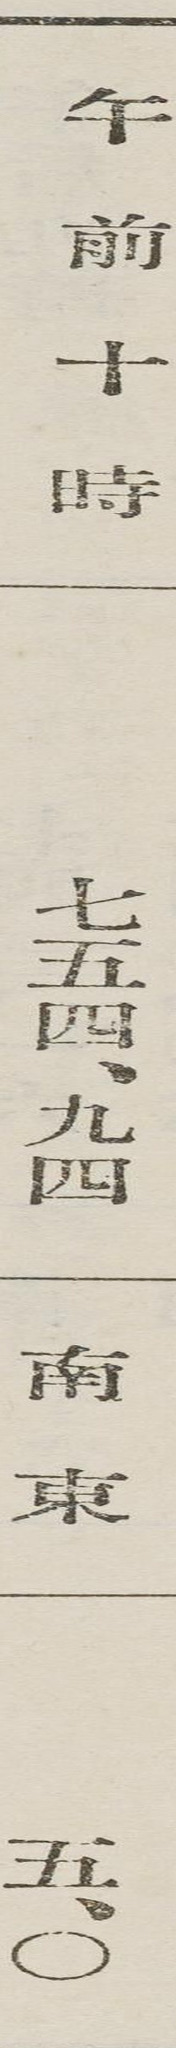午前十時七五四、九四南東五、〇
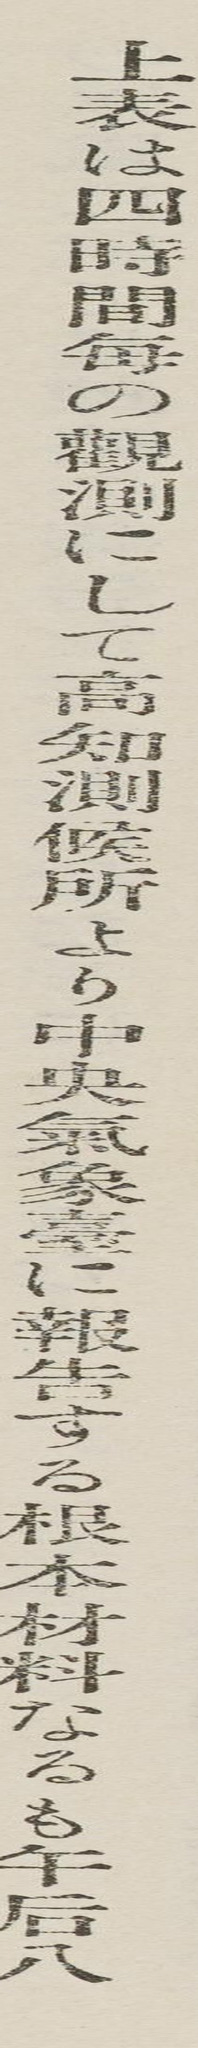上表は四時間毎の観測にして高知測候所より中央気象台に報告する根本材料なるも午后八
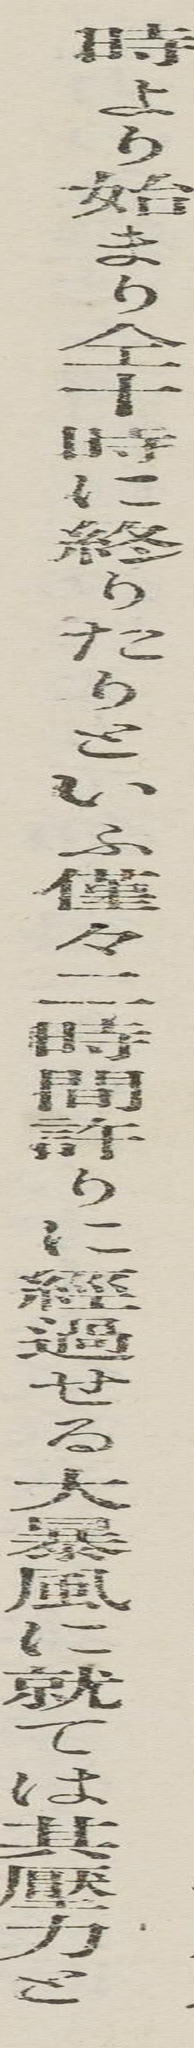時より始まり同十時に終りたりといふ僅々二時間許りに経過せる大暴風に就ては其圧力と

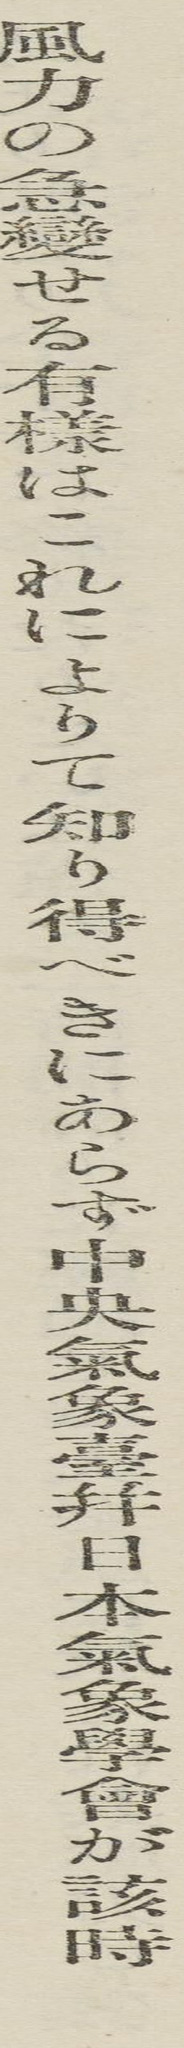風力の急変せる有様はこれによりて知り得べきにあらず中央気象台幷日本気象学会が該時
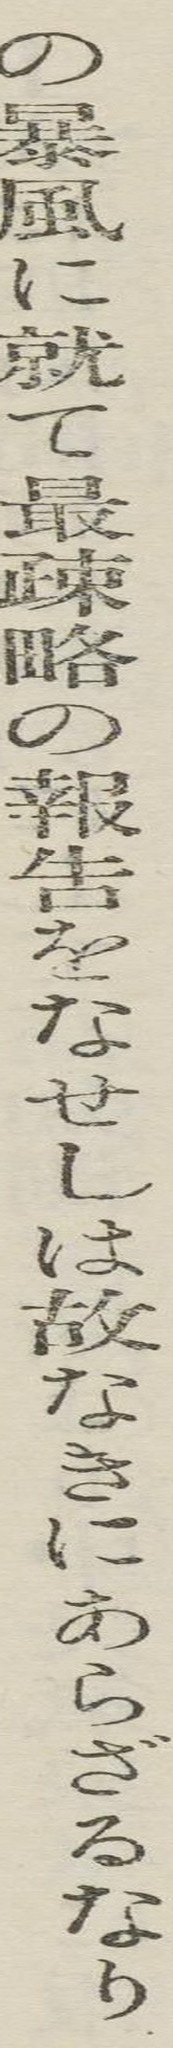の暴風に就て最疎略の報告をなせしは故なきにあらざるなり
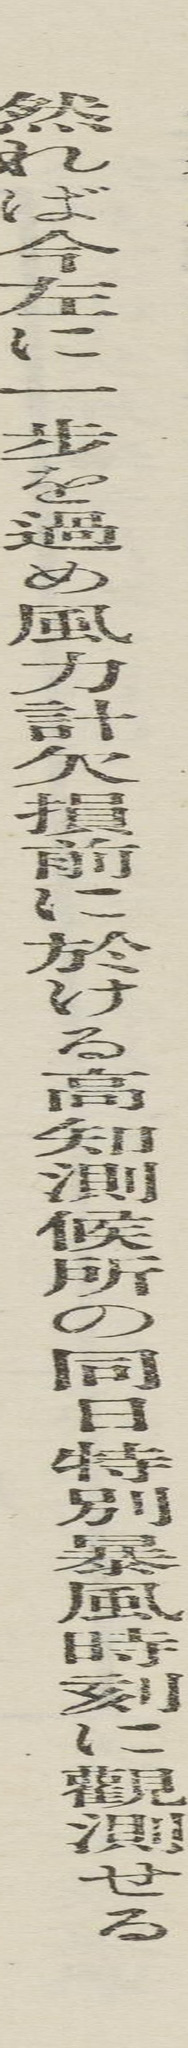然れば今左に一歩を過め風力計欠損前に於ける高知測候所の同日特別暴風時刻に観測せる
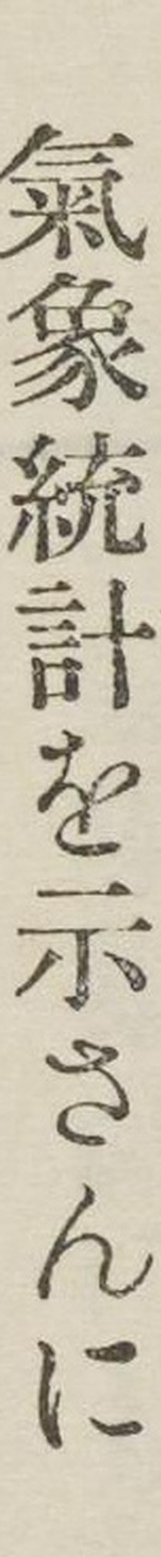気象統計を示さんに
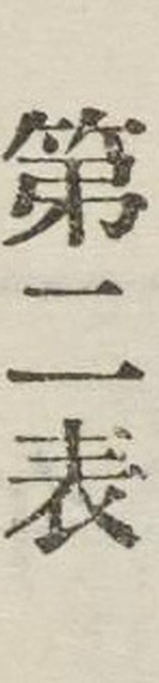第二表
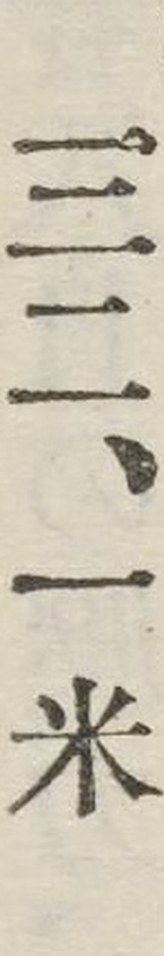三二、一米
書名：土佐古今ノ地震
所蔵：東京大学地震研究所図書室 Earthquake Research Institute Library, The University of Tokyo, JAPAN
